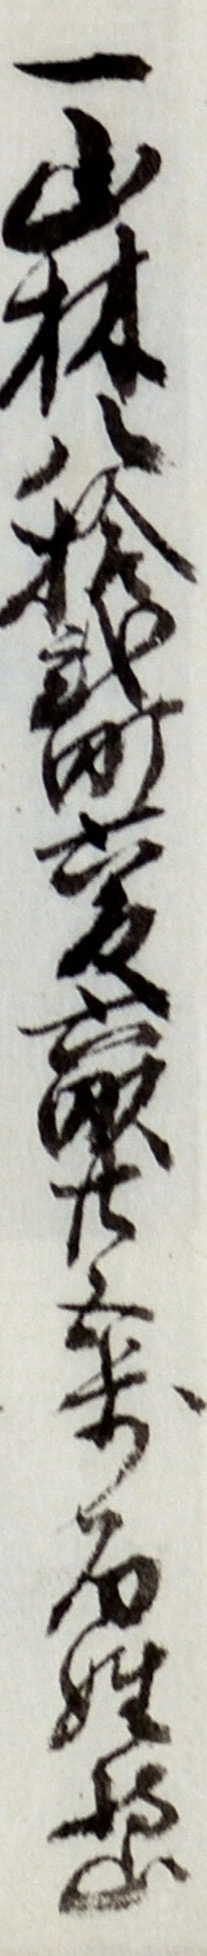一山林八拾弐町六反六畝廿五歩百姓持山
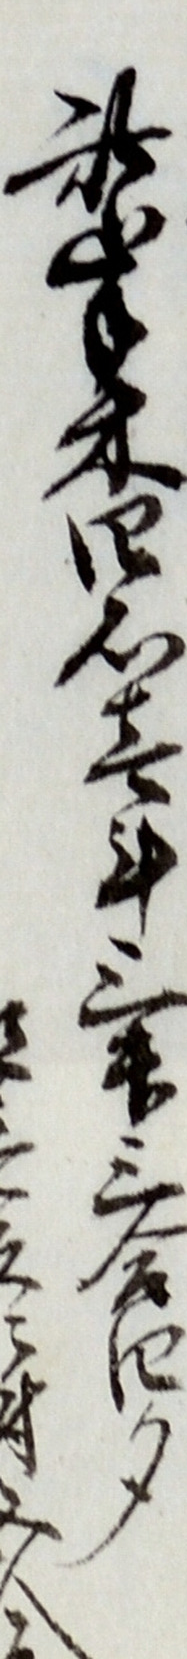此山手米四石壱斗三升三合四勺
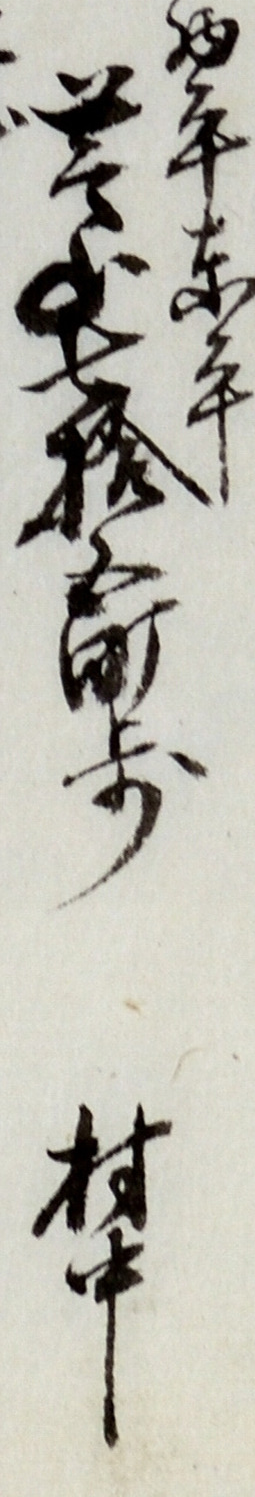芝山七拾五町歩村中
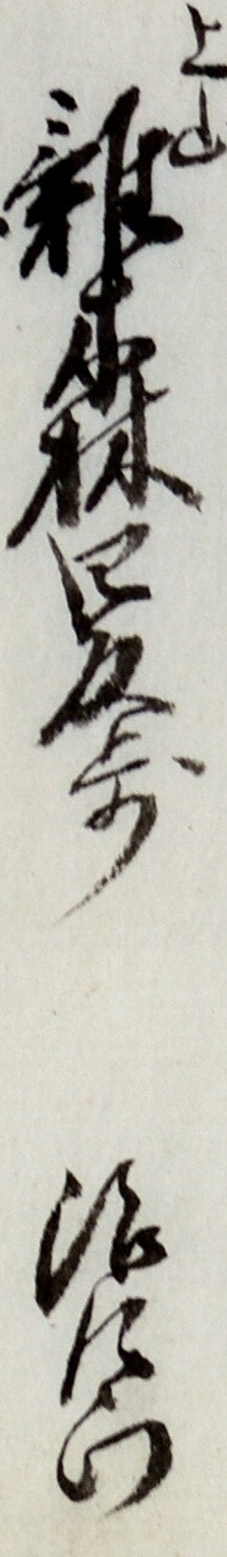雑木林四反歩治左衛門
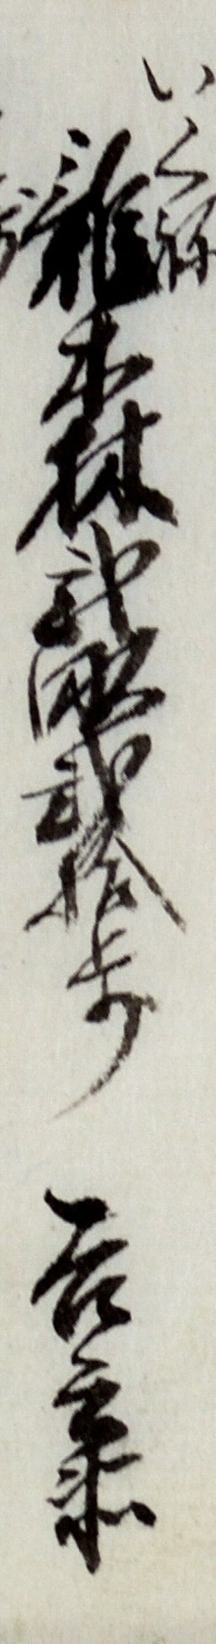雑木林弐畝弐拾歩吉兵衛
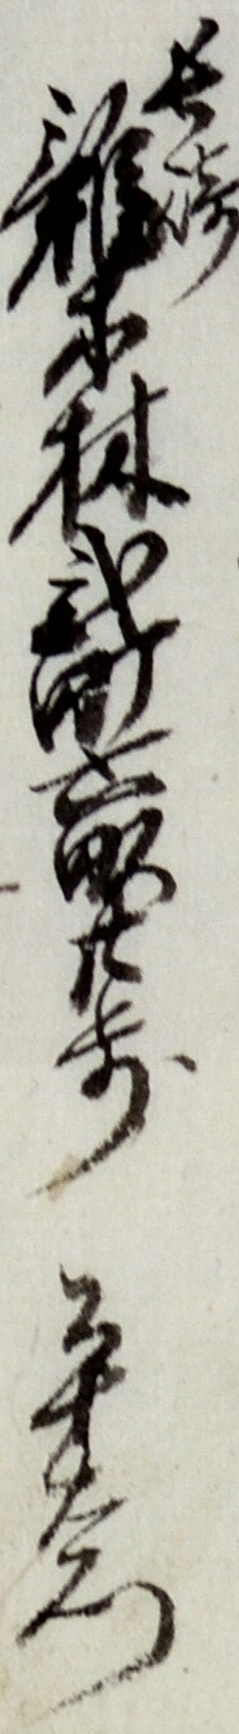雑木林弐町六畝廿歩平右衛門

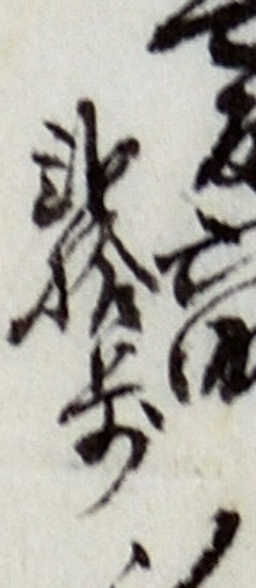弐拾歩
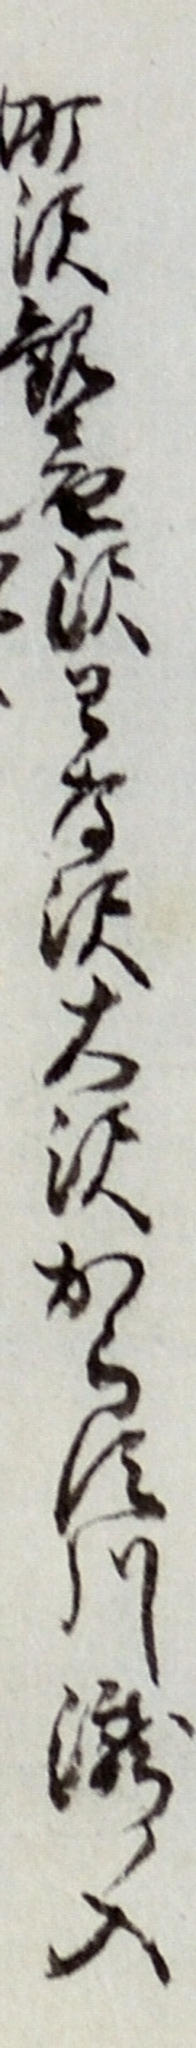町沢観音沢わな沢大沢からす川滝ノ入
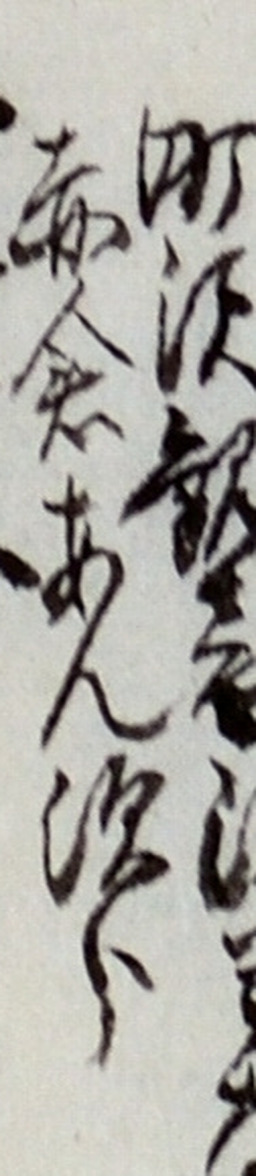赤倉あん次郎
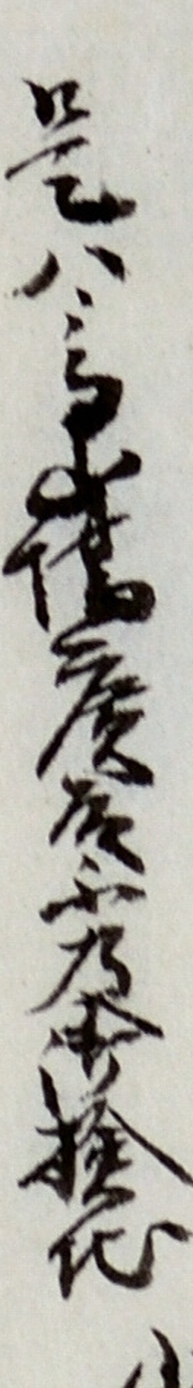是ハ高山場広故不及御検地

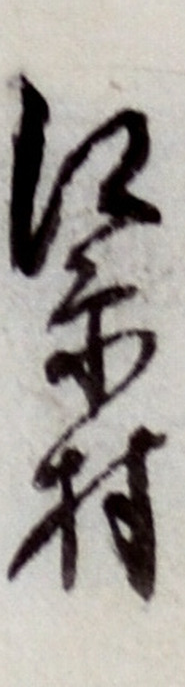江原村
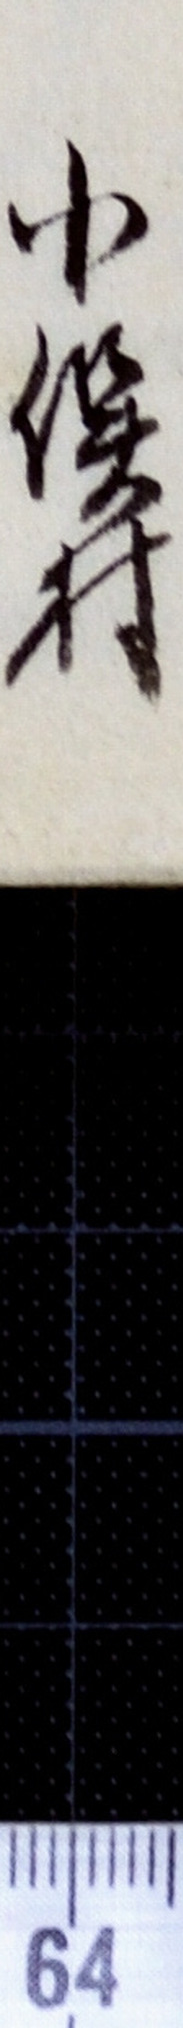小俣村
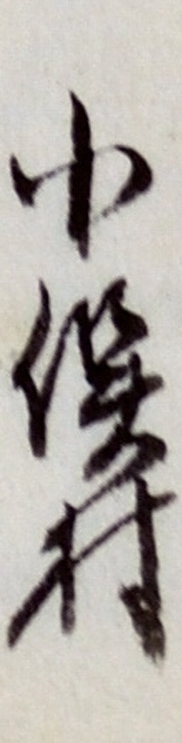小俣村
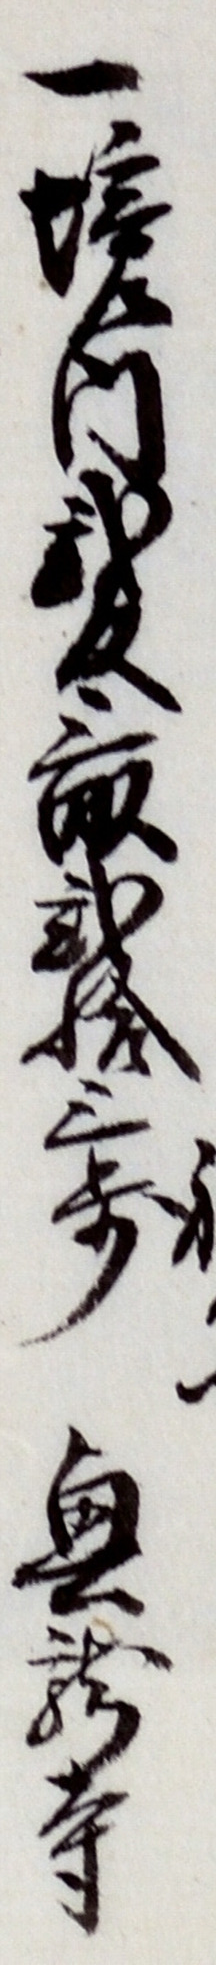一境内弐反三畝弐拾三歩興竜寺
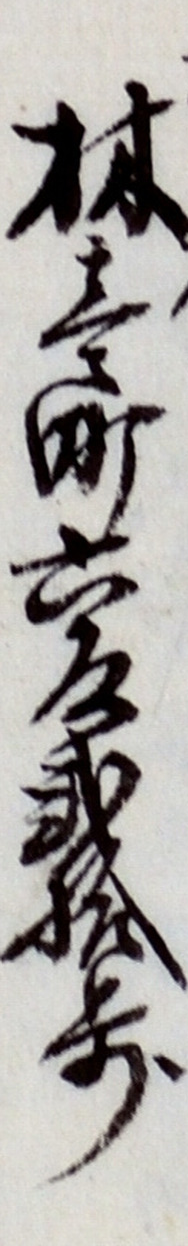林壱町六反弐拾歩同寺
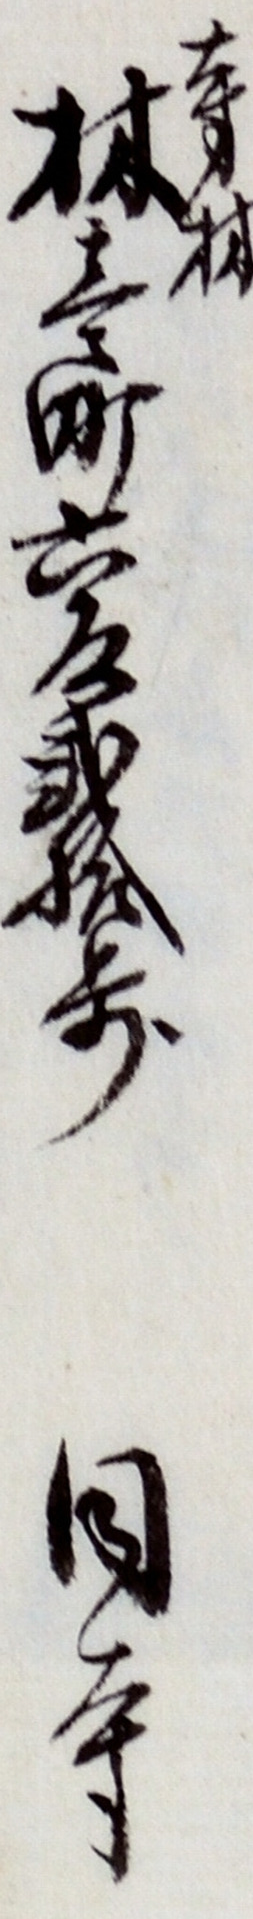林壱町六反弐拾歩同寺
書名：御領分中山林社地手控
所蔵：伊那市立高遠町図書館・合同会社AMANE
